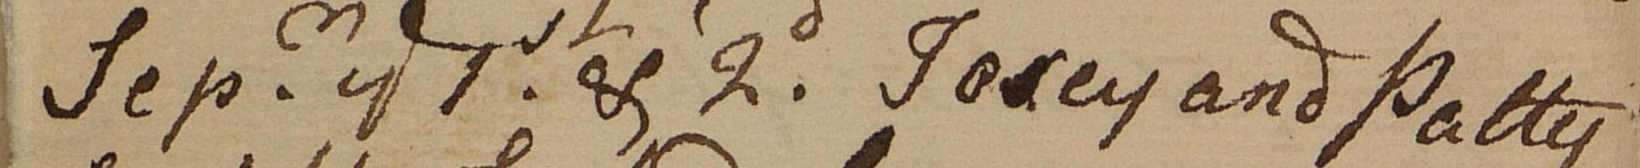Sep^r. y^e 1^st & 2^d. Josey and Patty
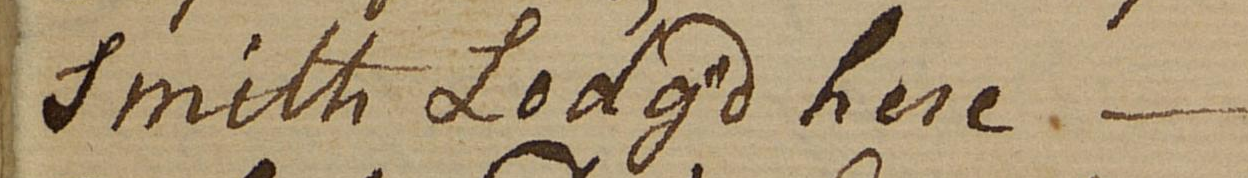Smith Lodg'd here-
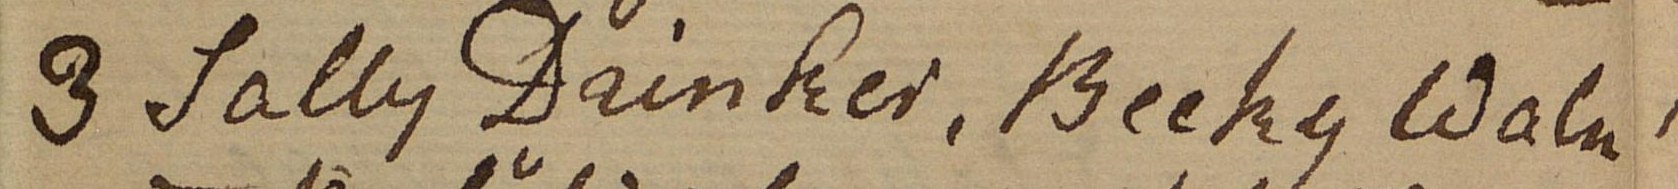3 Sally Drinker, Becky Waln
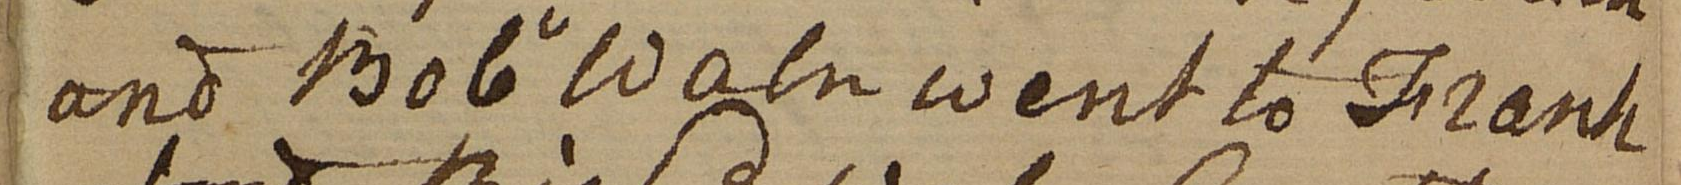and Rob^t Waln went to Frank
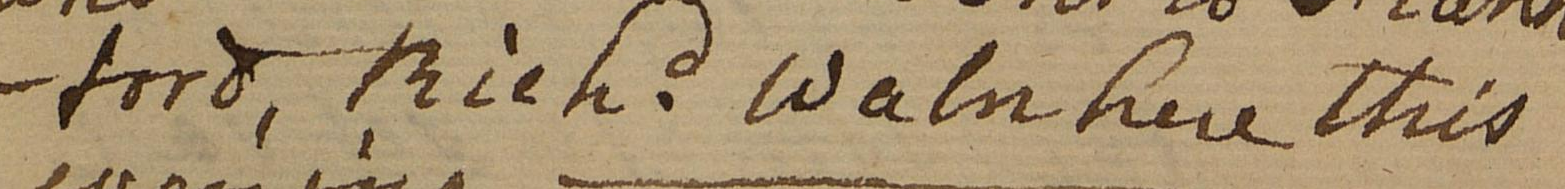-ford, Rich^d. Waln here this
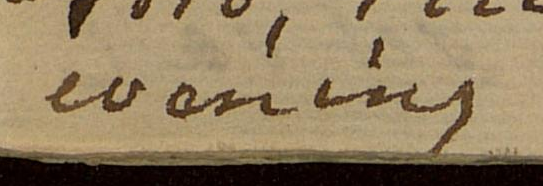evening
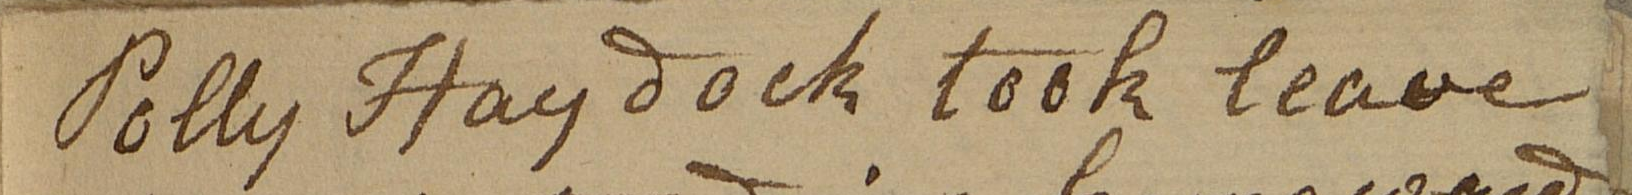Polly Haydock took leave
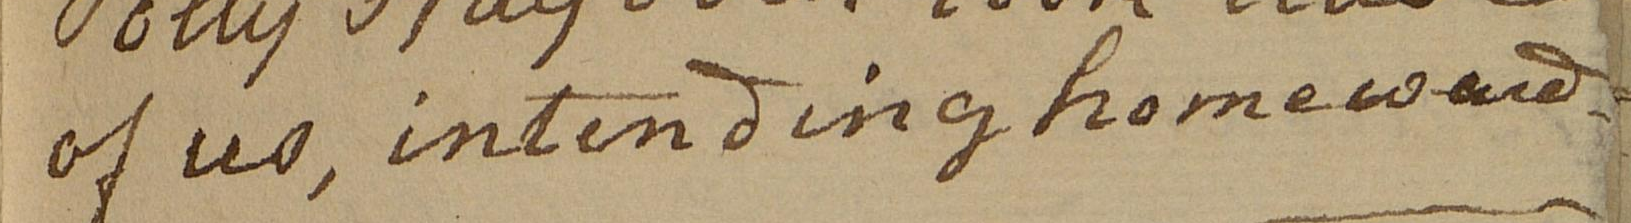of us, intending homeward
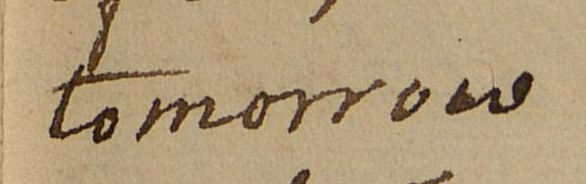tomorow
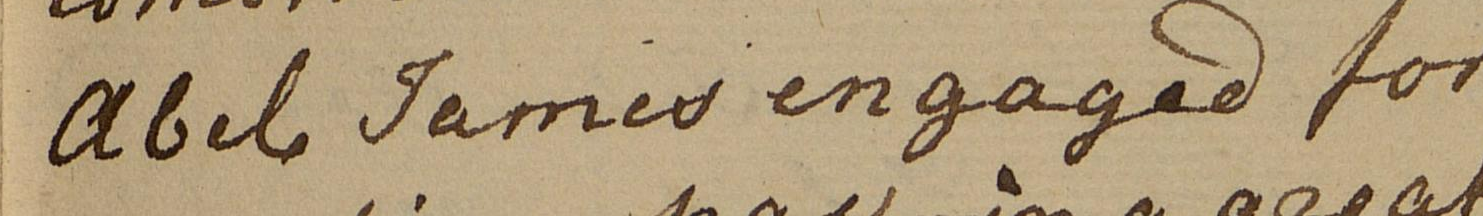Abel James engaged for
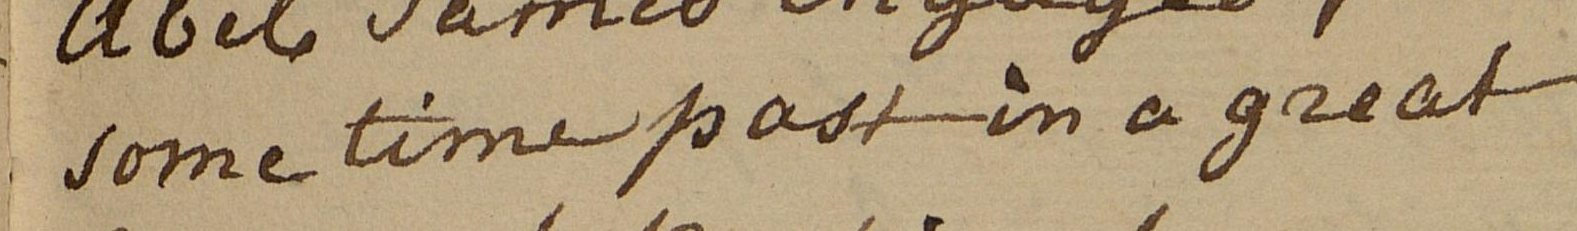some time past in a great
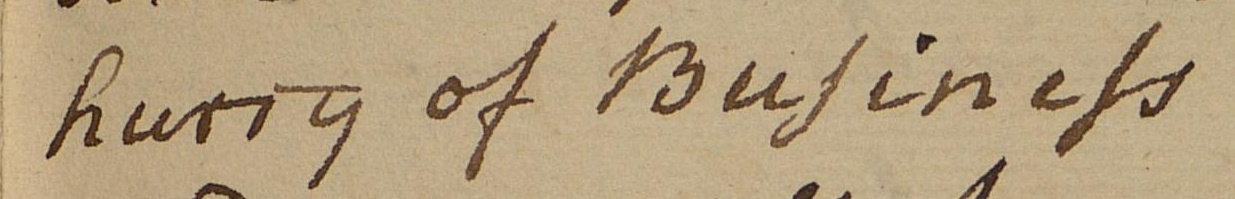hurry of Business-
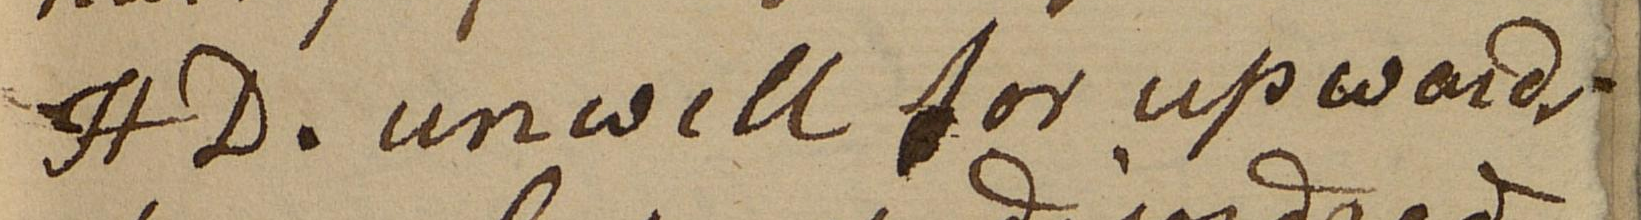HD. unwell for upwards
